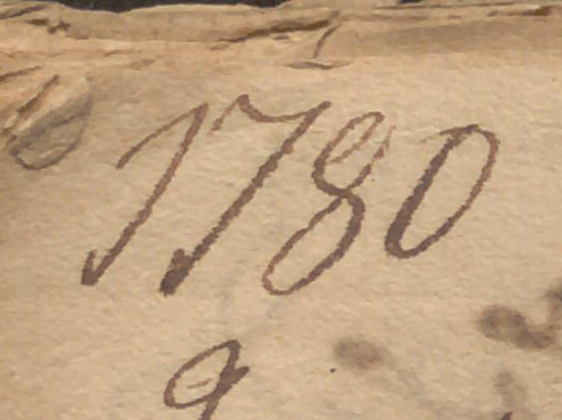1780
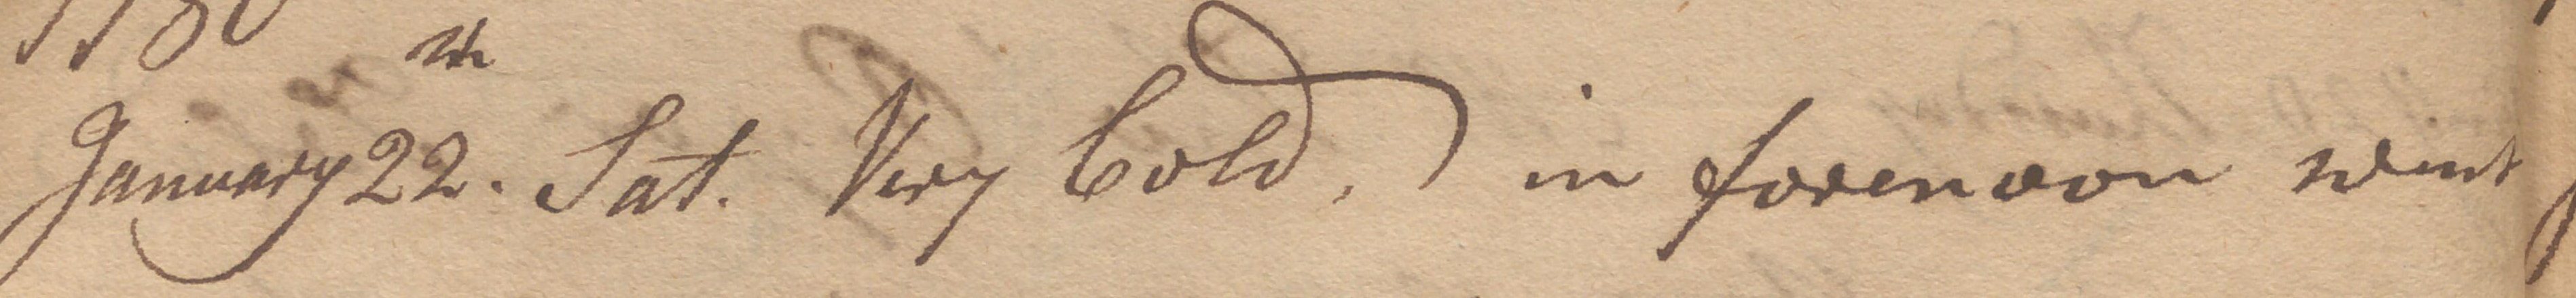January 22^th. Sat. Very Cold, in forenoon went
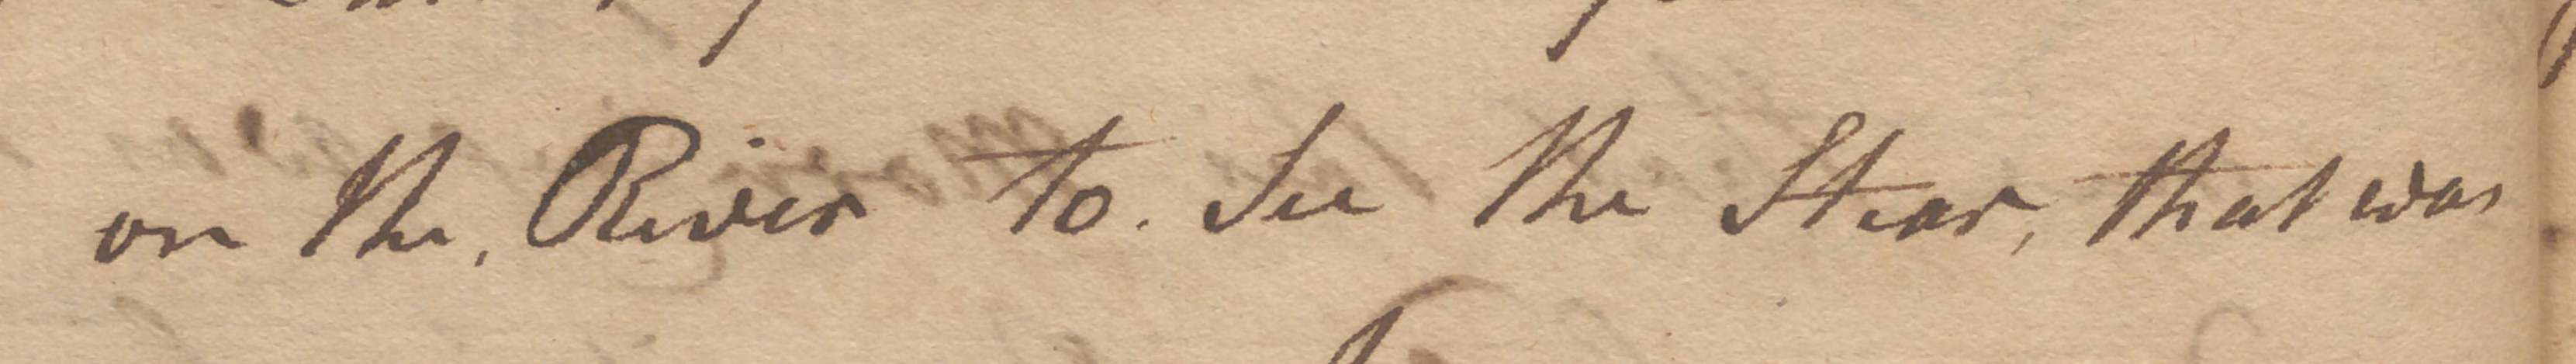on the River to see the Stear, that was
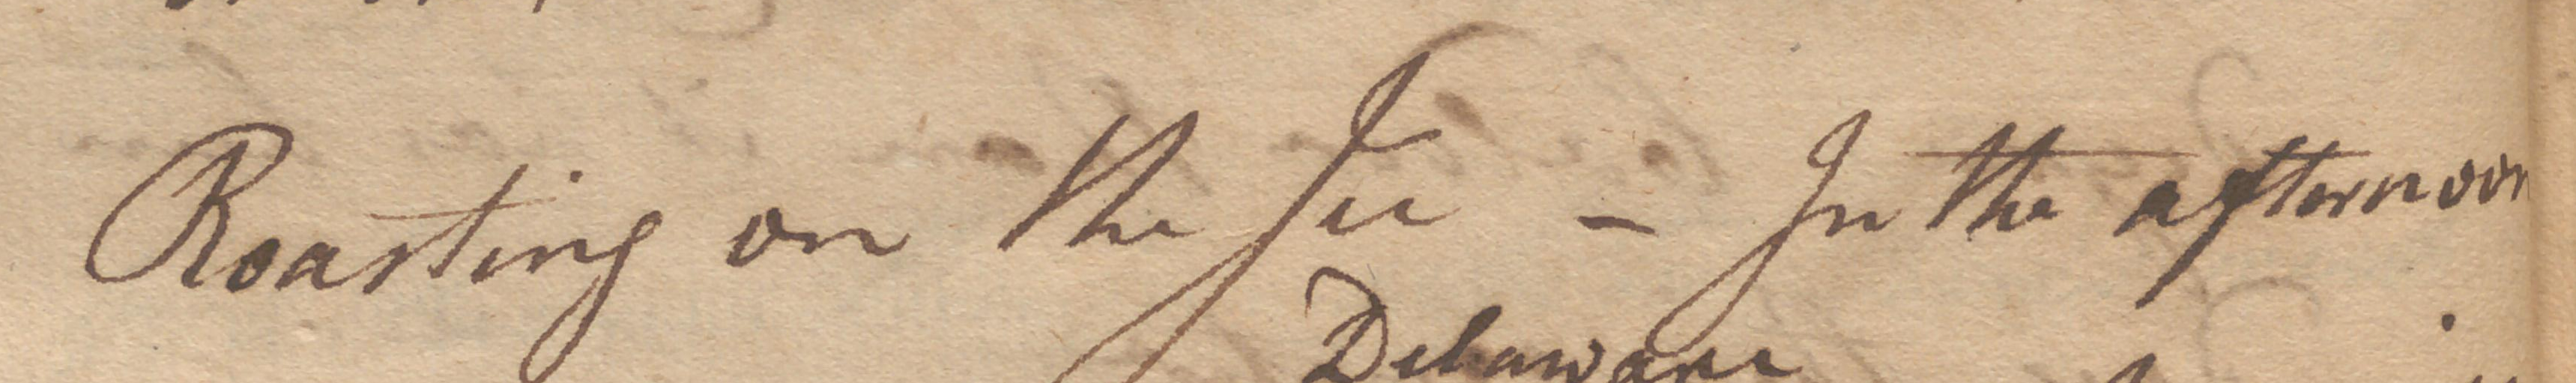Roasting on the Ice- In the afternoon
